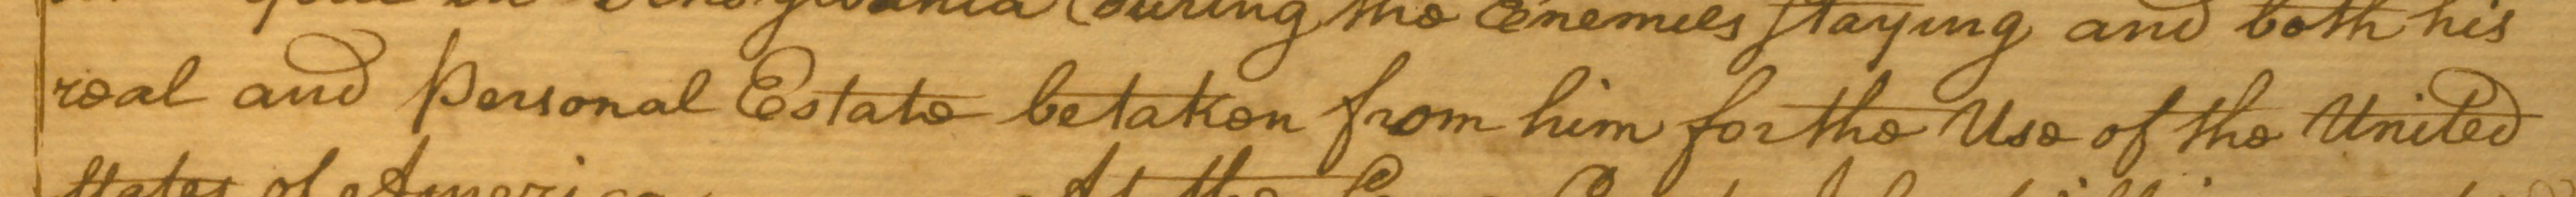real and personal Estate be taken from him for the Use of the United
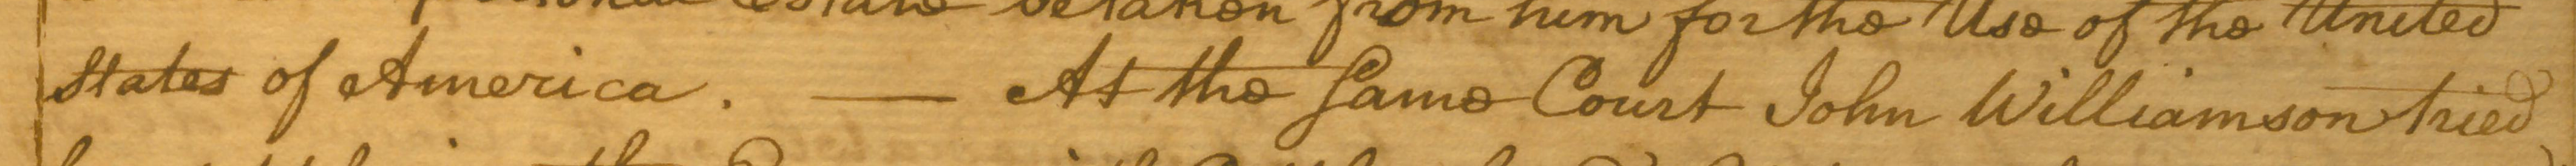States of America.- At the same court John Williamson tried
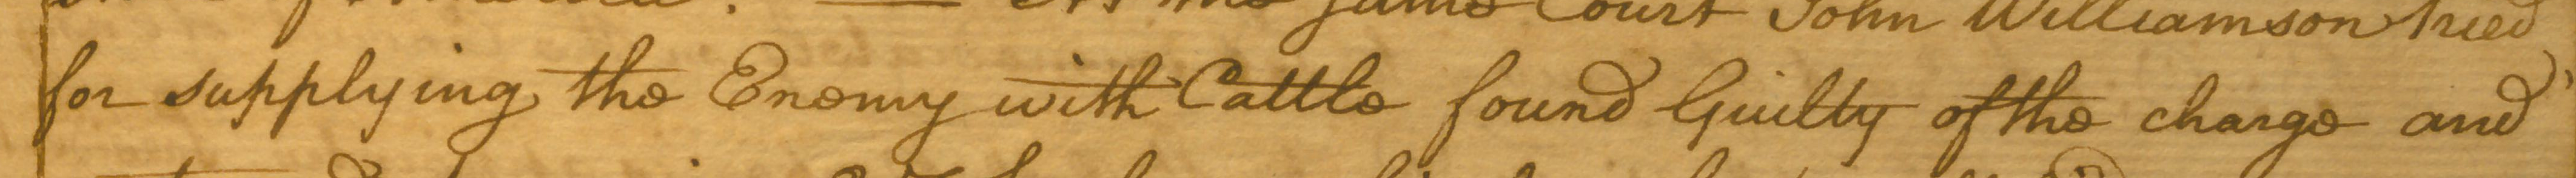for supplying the Enemy with Cattle found Guilty of the charge and
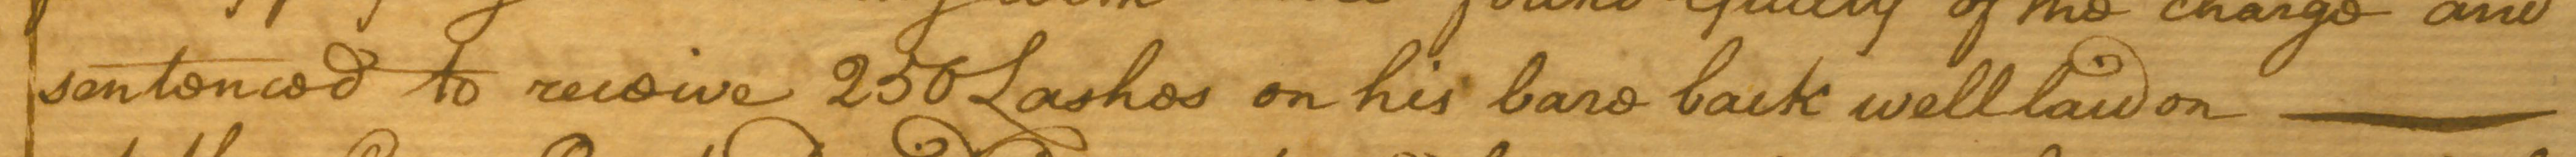sentenced to receive 250 Lashes on his bare back well laid on-
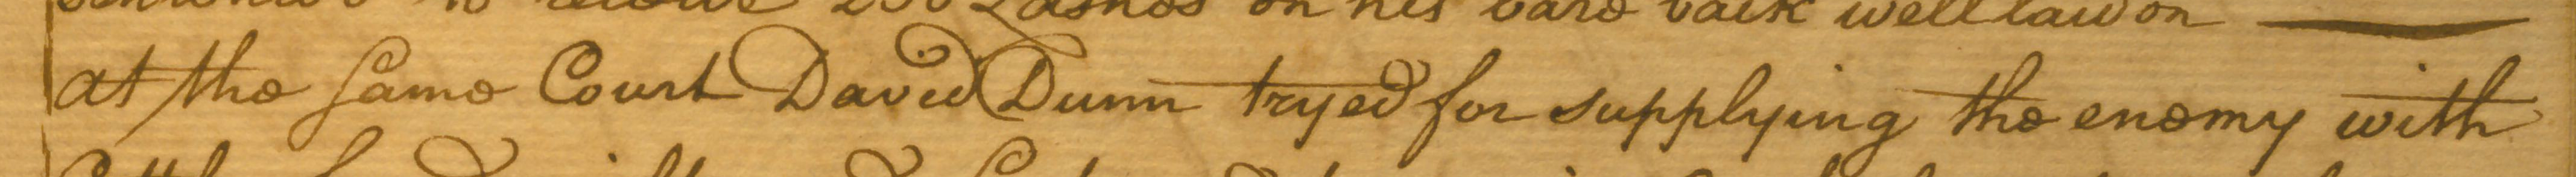at the same Court David Dunn tryed for supplying the enemy with
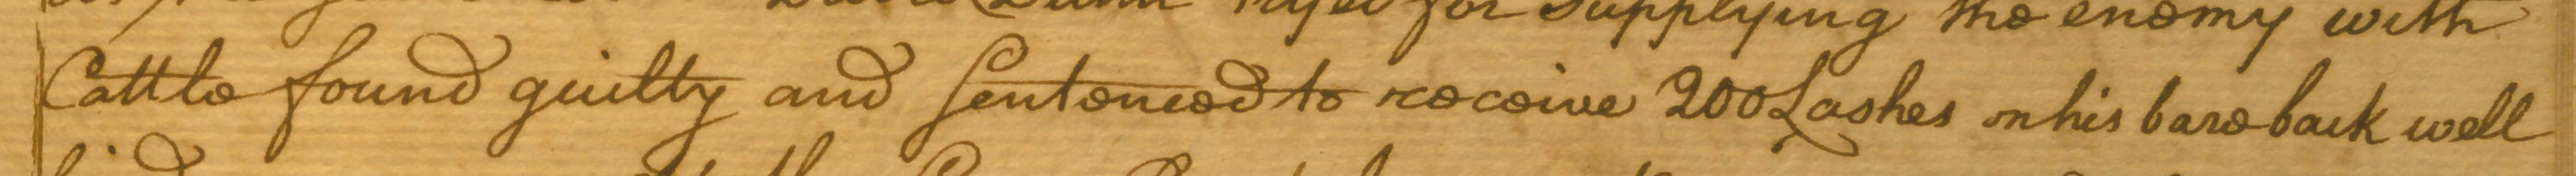Cattle found guilty and sentenced to receive 200 Lashes on his bare back well
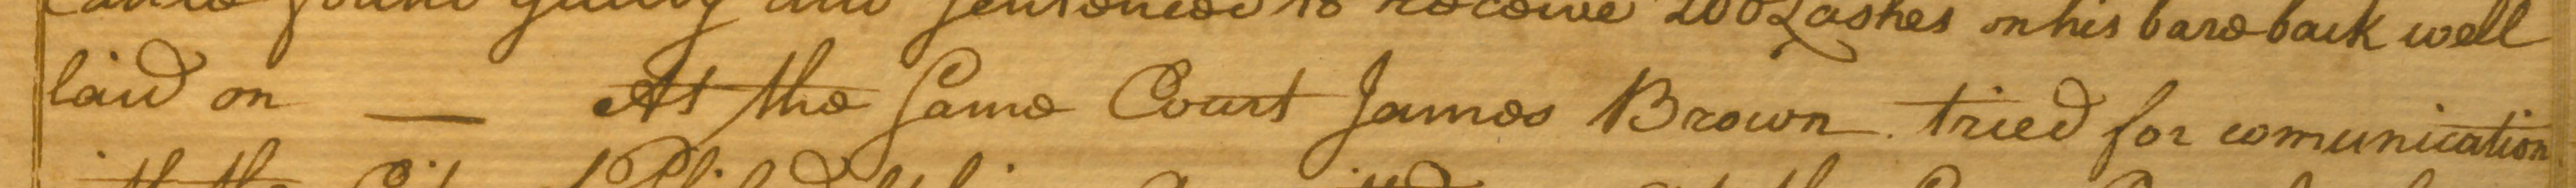laid on- At the same Court James Brown tried for comunication
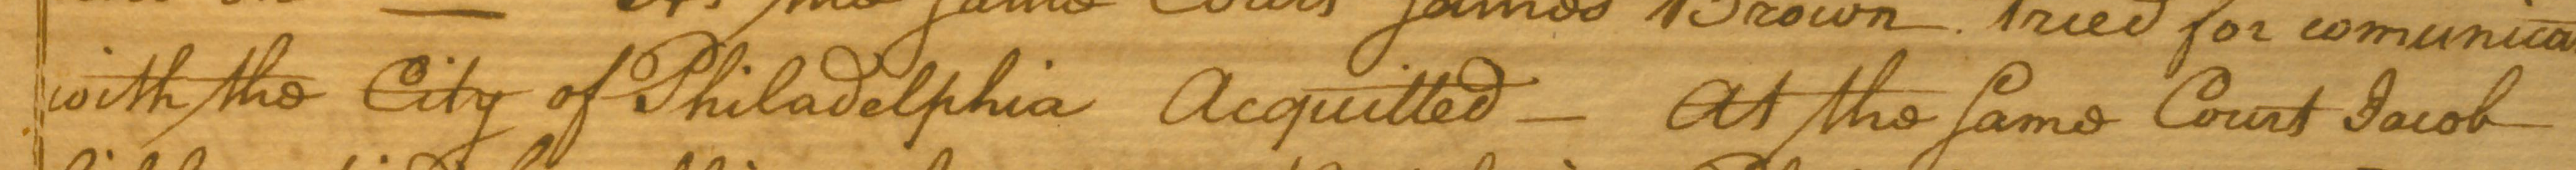with the City of Philadelphia Acquitted- At the same Court Jacob
